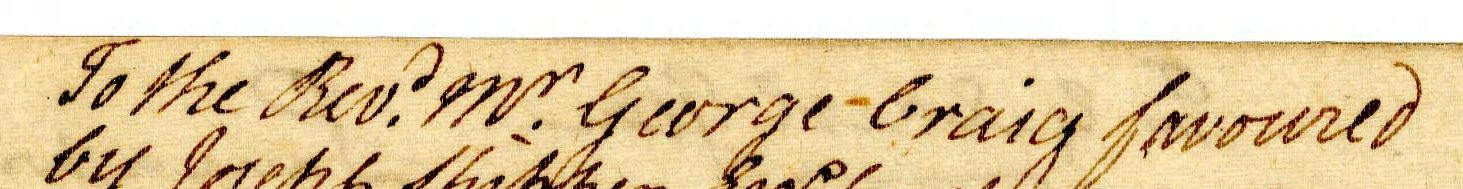To the Rev^d. M^r. George Craig favoured
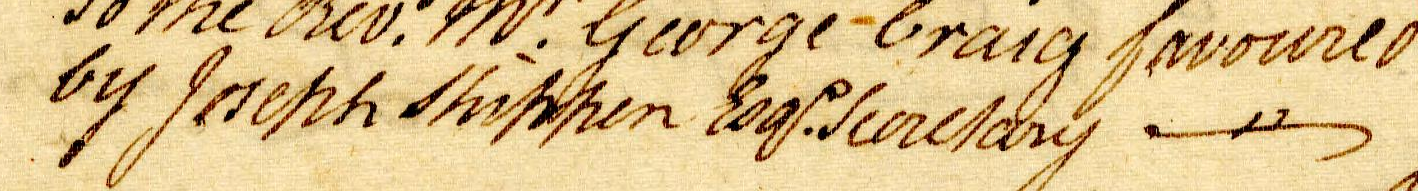by Joseph Shippen Esq^r. Secretary-
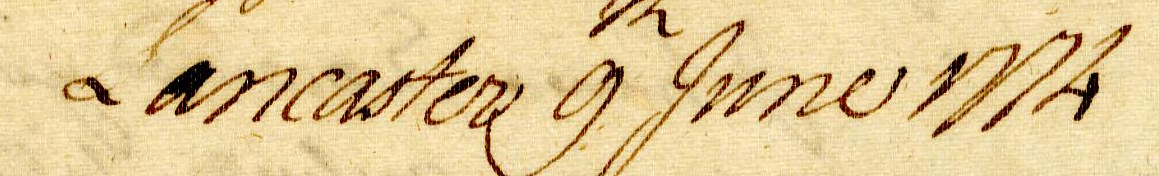Lancaster 9^th June 1774
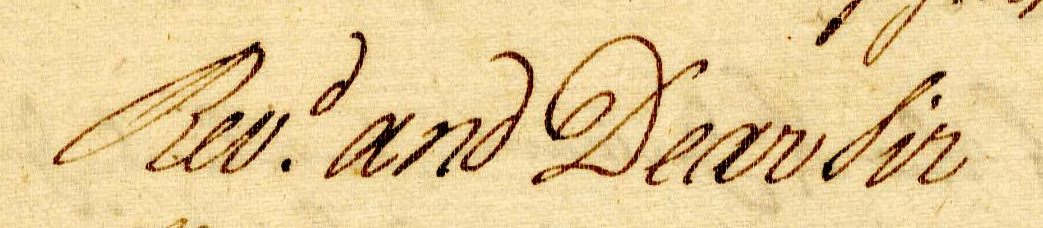Rev.^d and Dear Sir
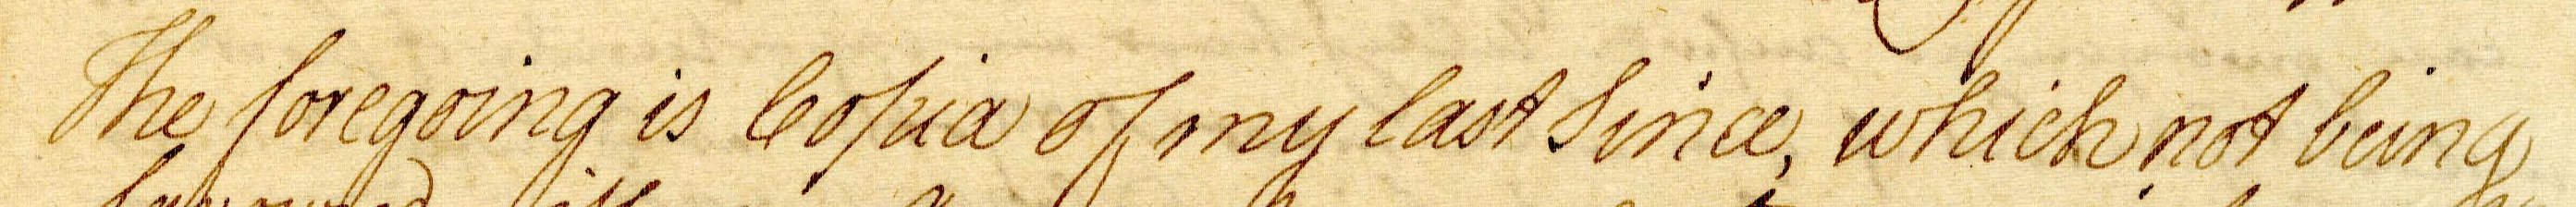the foregoing is Copia of my last Since, which not being
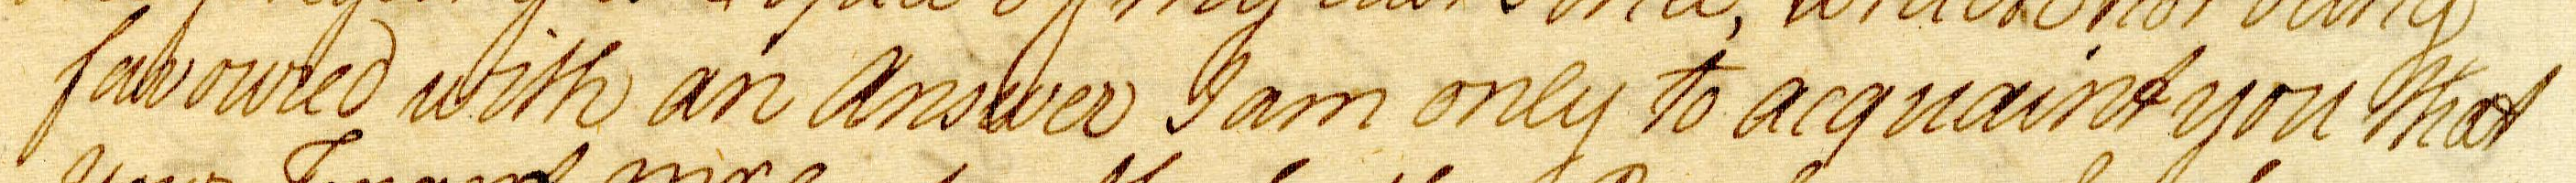favoured with an answer I am only to acquaint you that
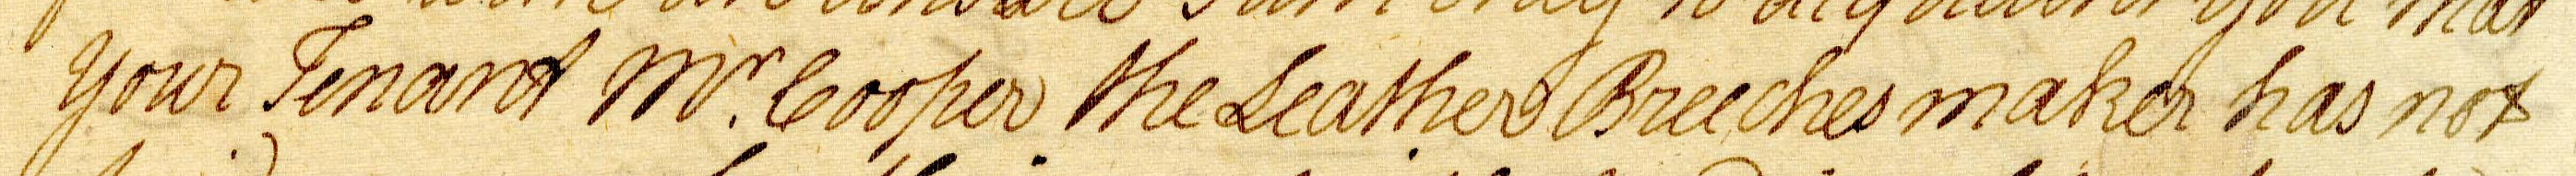Your Tenant M^r. Cooper the Leather Breeches maker has not
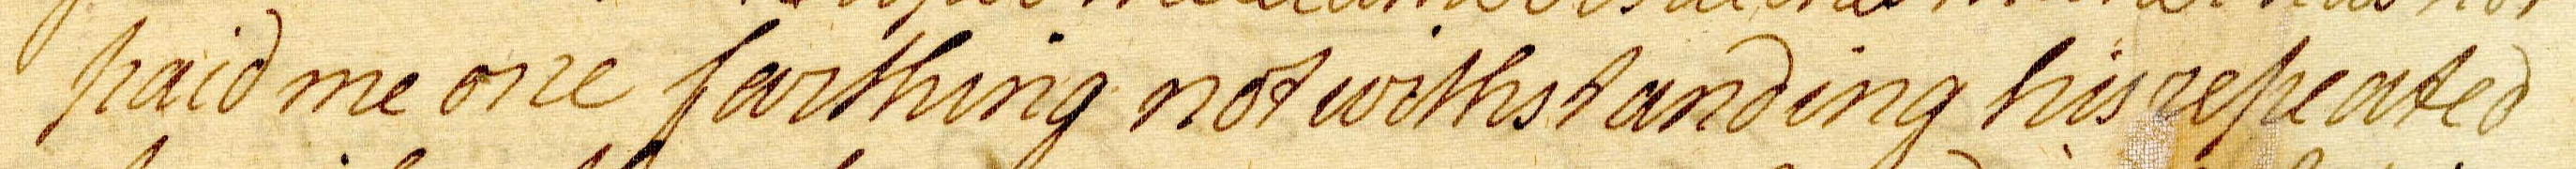paid me one farthing not withstanding his repeated
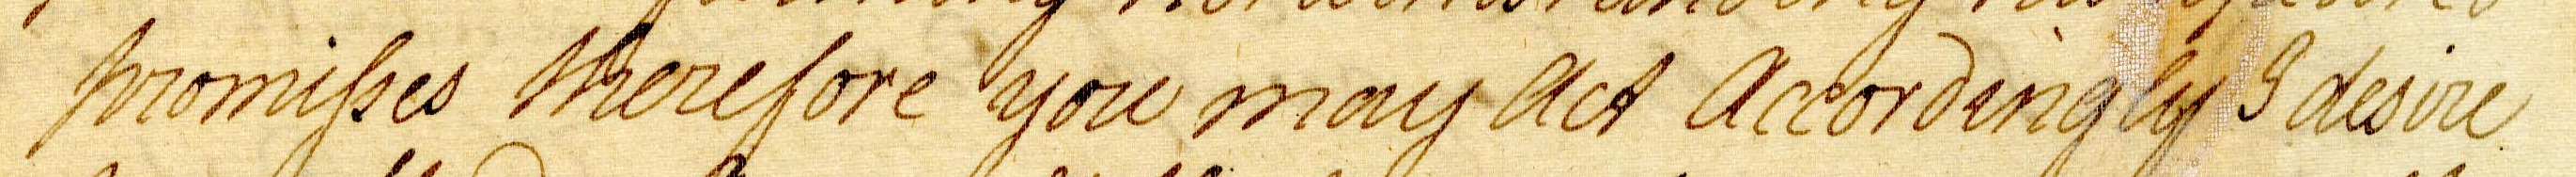promises therefore you may Act Accordingly I desire
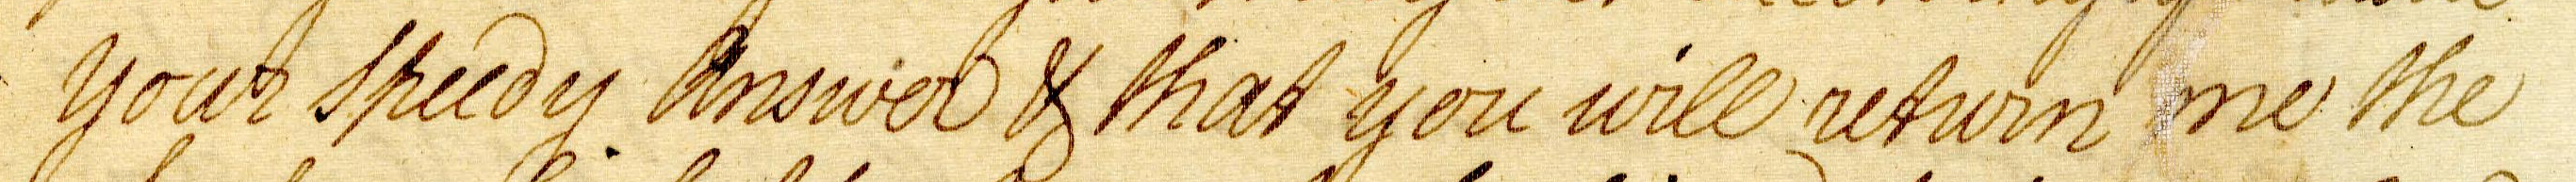Your Speedy Answer & that you will return me the
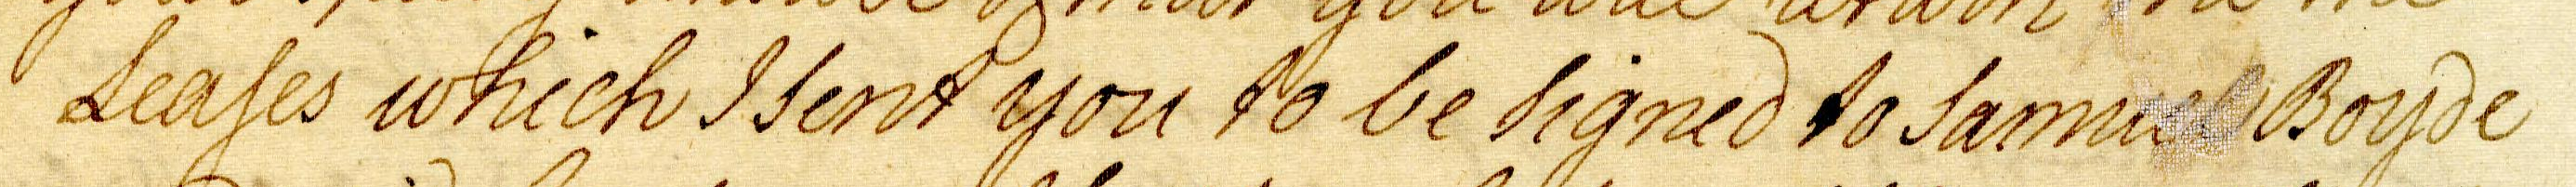Leases which I sent you to be signed to Samuel Boyde
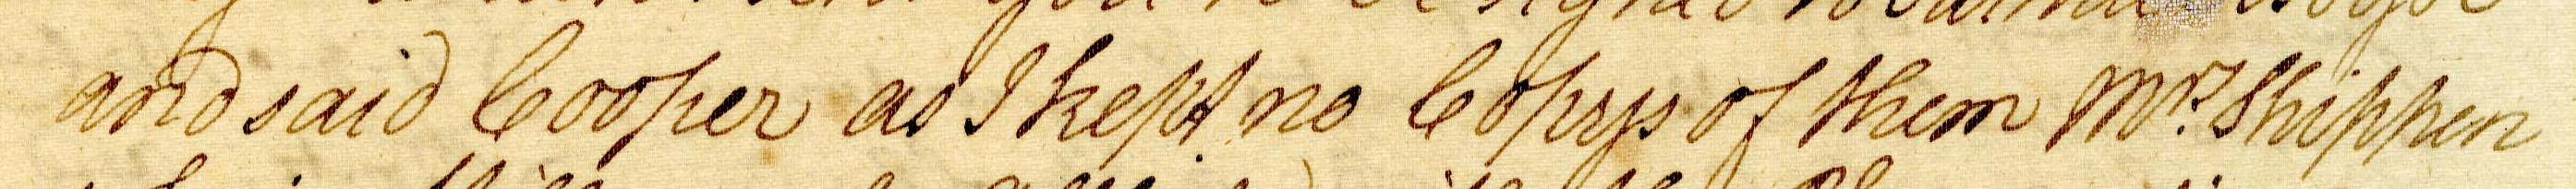and said Cooper as I kept no Copies of them M^rs. Shippen
